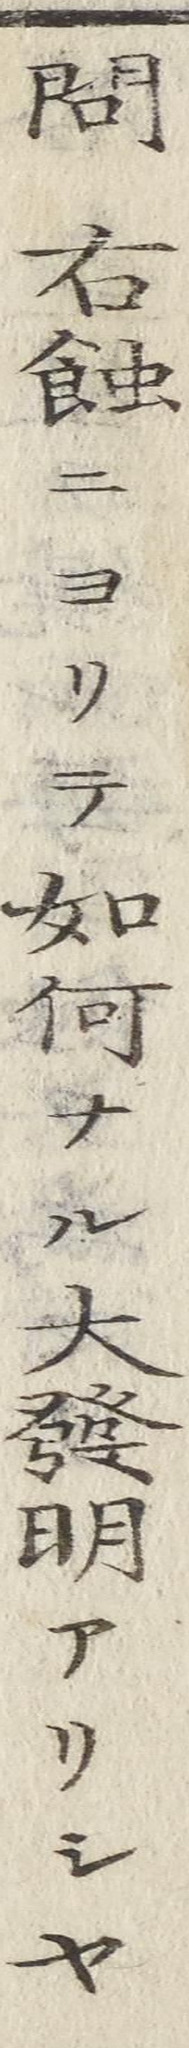問右蝕ニヨリテ如何ナル大発明アリシヤ
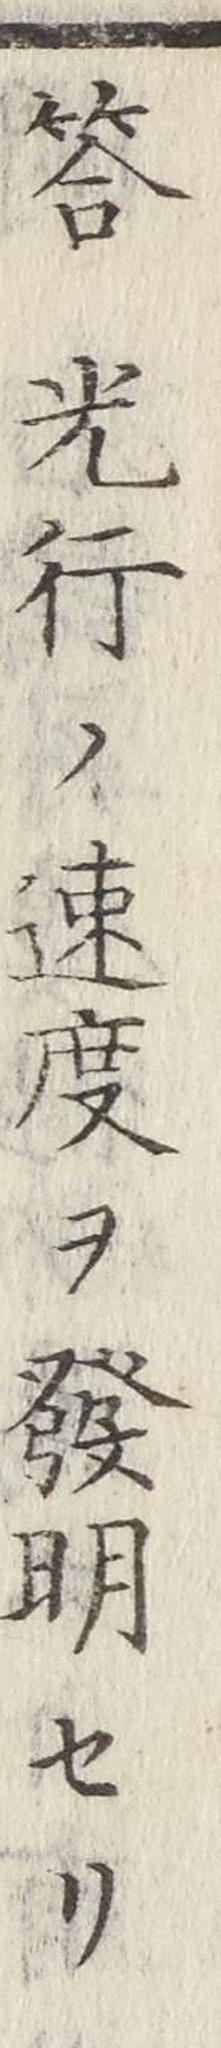答光行ノ速度ヲ発明セリ
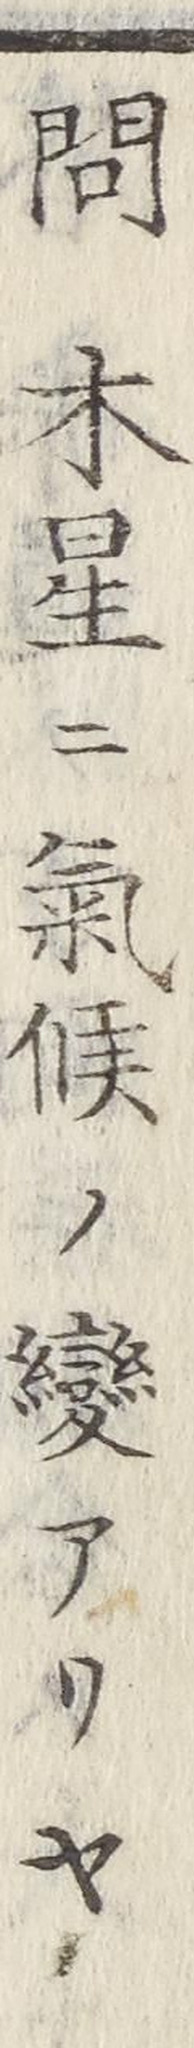問木星ニ気候ノ変アリヤ
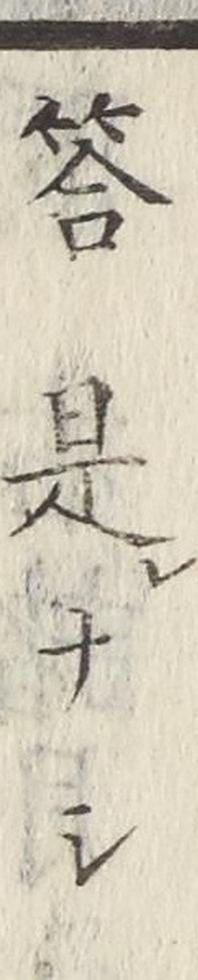答是レナシ
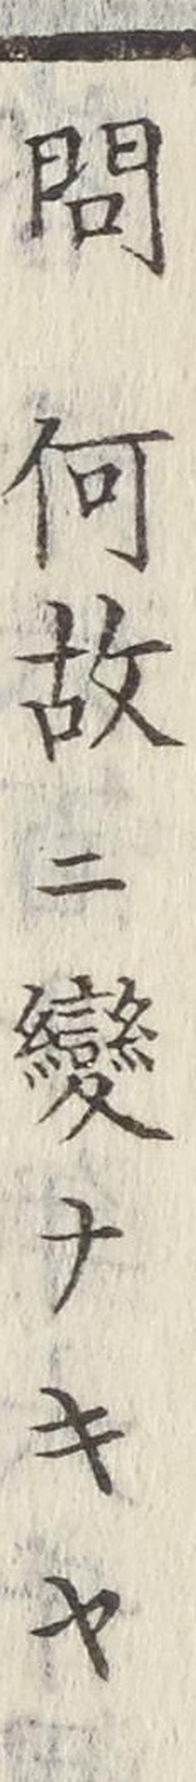問何故ニ変ナキヤ
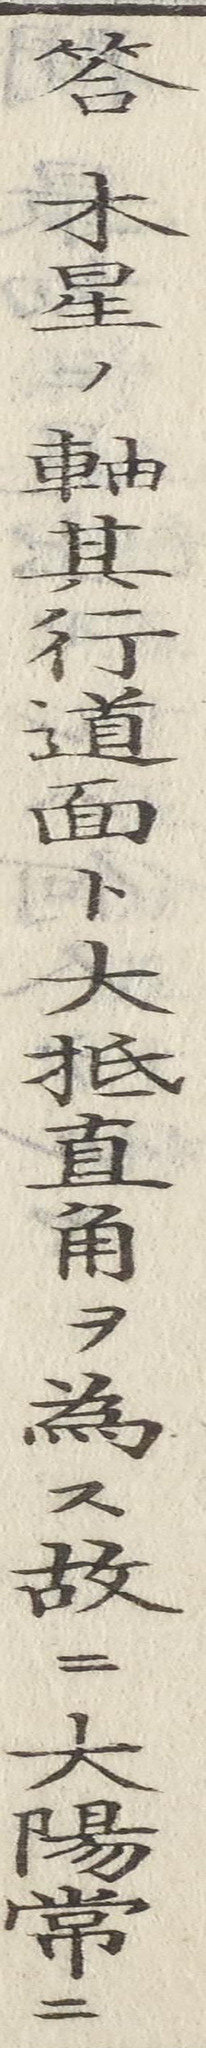答木星ノ軸其行道面ト大抵直角ヲ為ス故ニ大陽常ニ
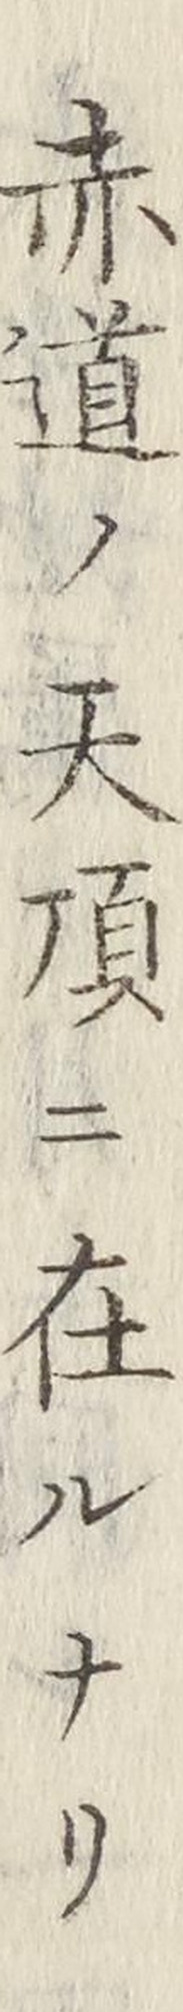赤道ノ天頂ニ在ルナリ
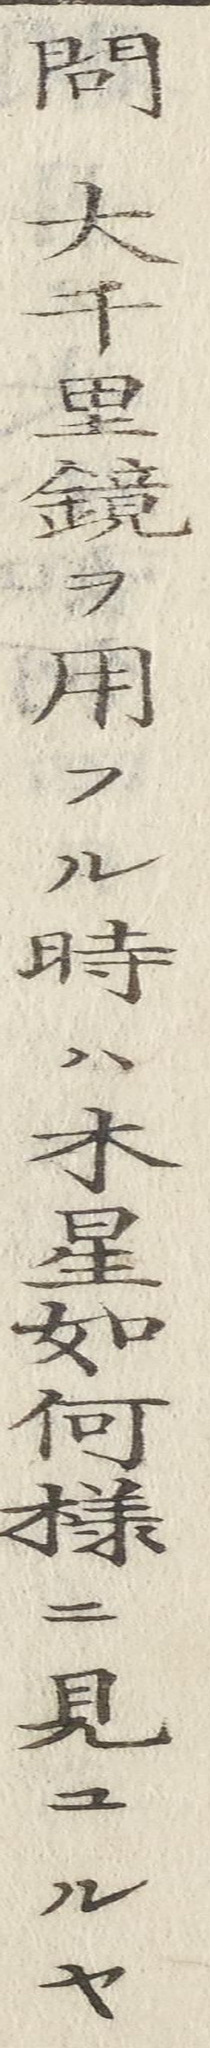問大千里鏡ヲ用フル時ハ木星如何様ニ見ユルヤ
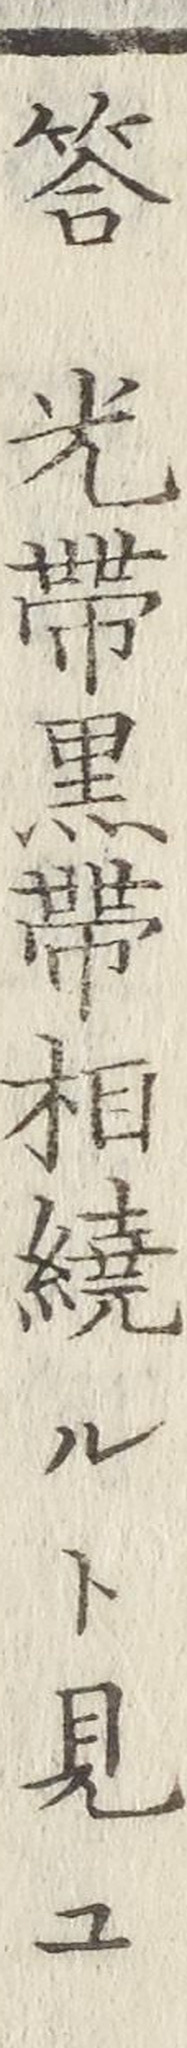答光帯黒帯相繞ルト見ユ
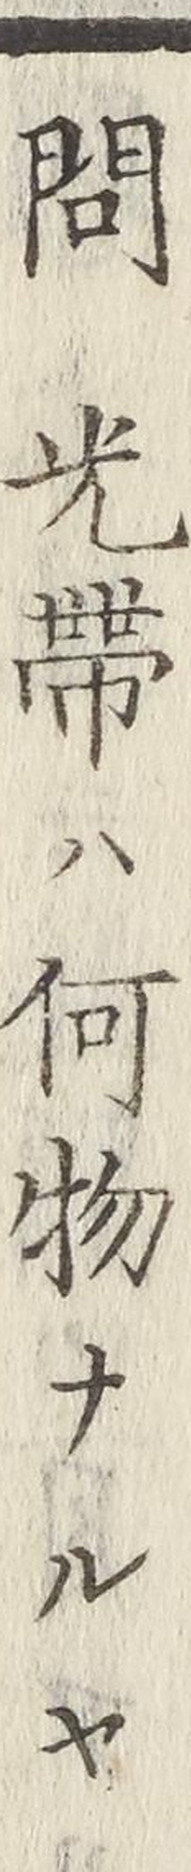問光帯ハ何物ナルヤ
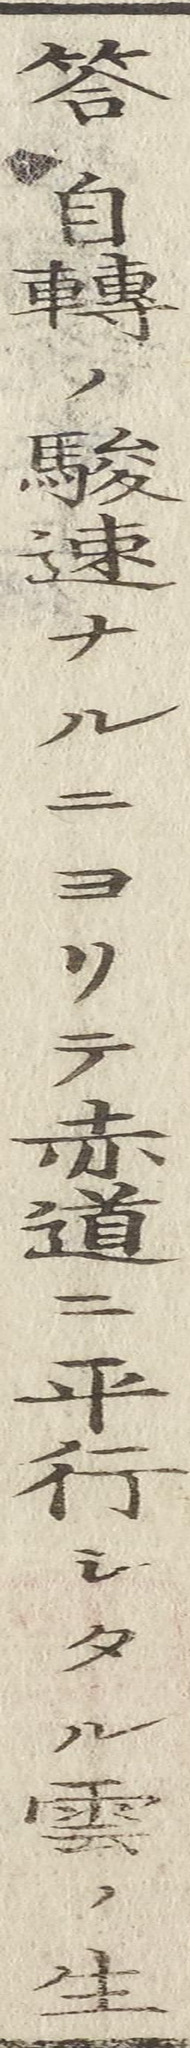答自転ノ駿速ナルニヨリテ赤道ニ平行シタル雲ノ生
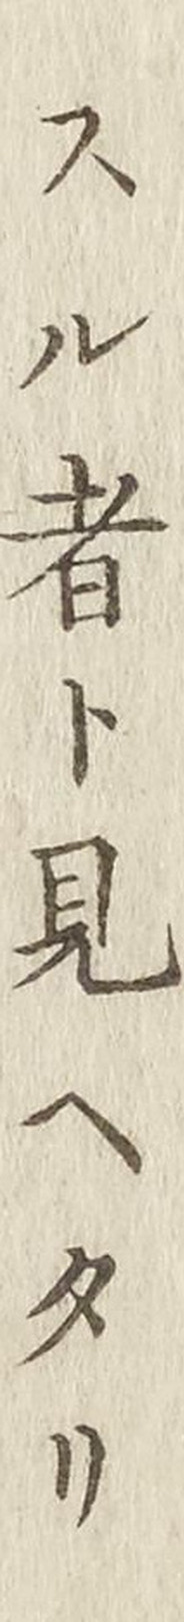スル者ト見ヘタリ
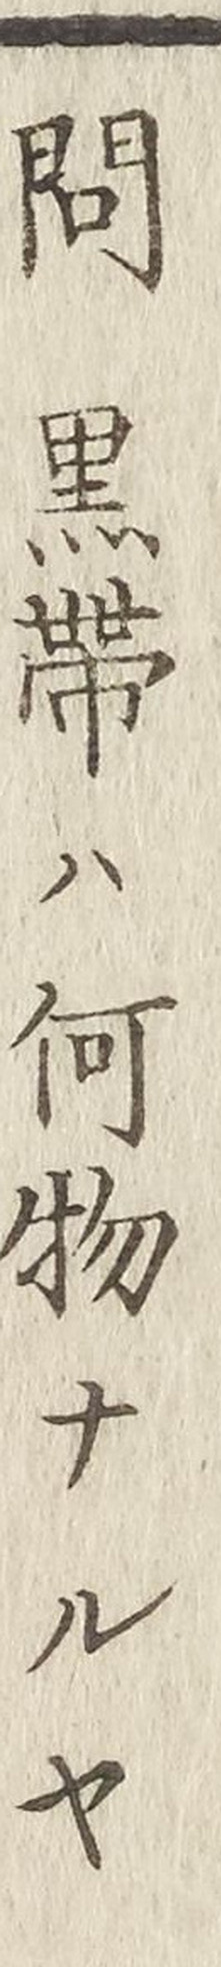問黒帯ハ何物ナルヤ
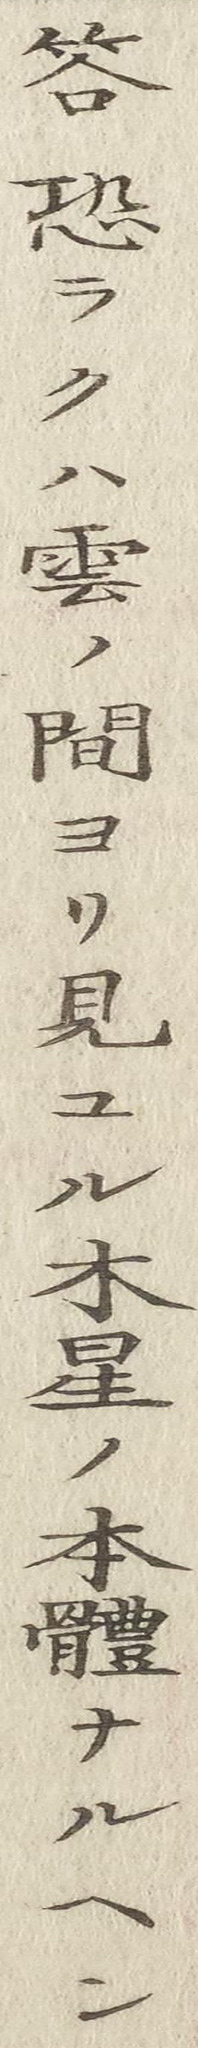答恐ラクハ雲ノ間ヨリ見ユル木星ノ本体ナルヘシ
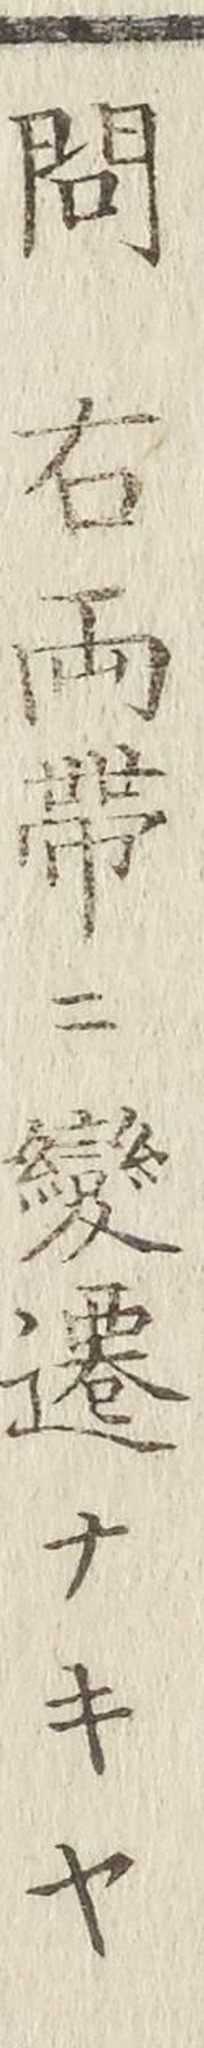問右両帯ニ変遷ナキヤ
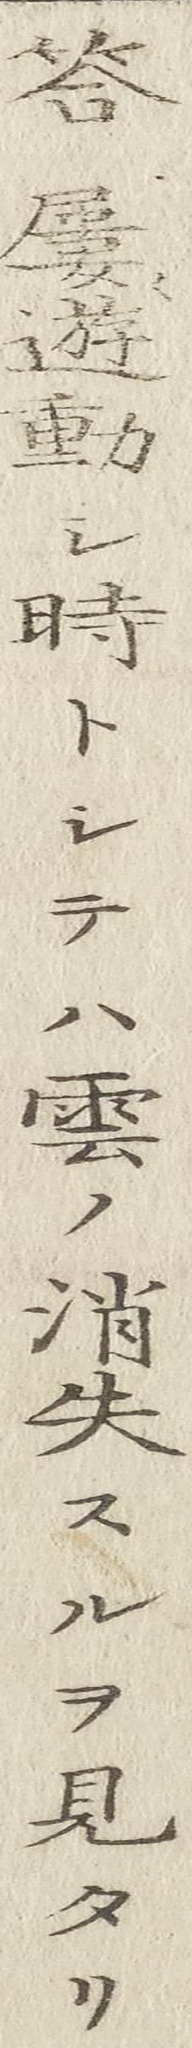答屢々遊動シ時トシテハ雲ノ消失スルヲ見タリ
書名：星学圖説　上
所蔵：東京大学地震研究所図書室 Earthquake Research Institute Library, The University of Tokyo, JAPAN
